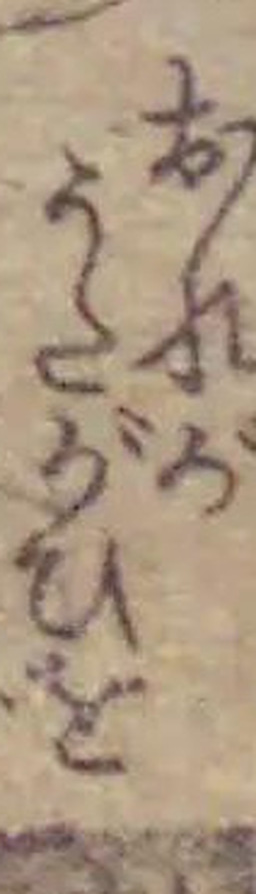うたがひを
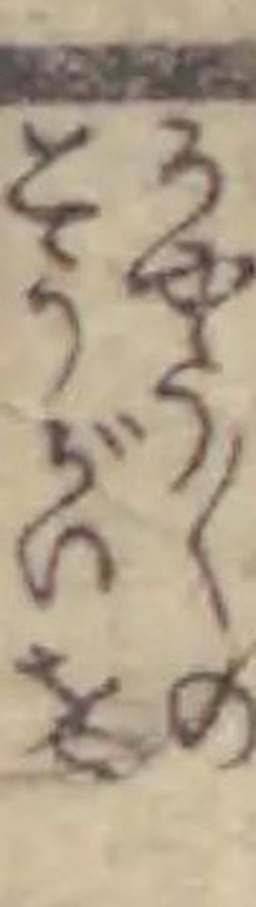こうがいを
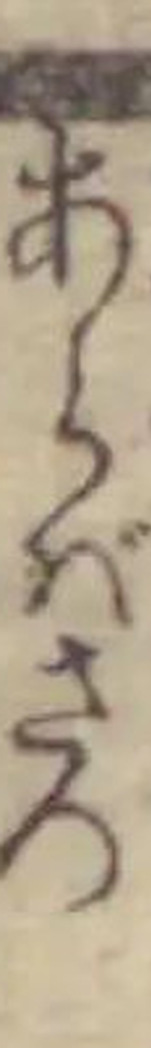あらばさつ
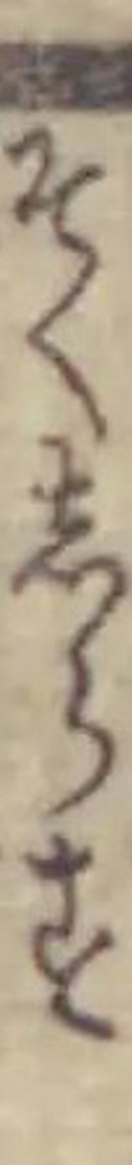そくしらす
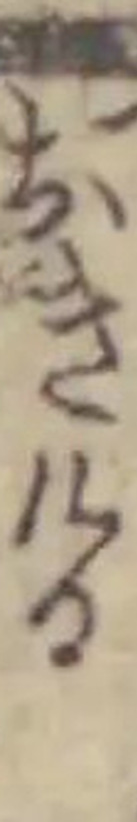おきける
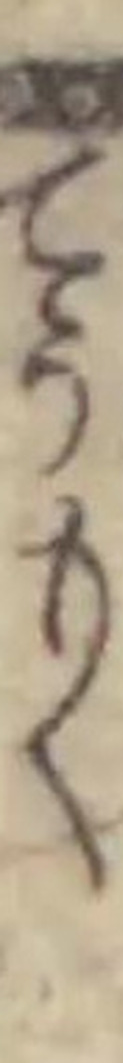てうもく
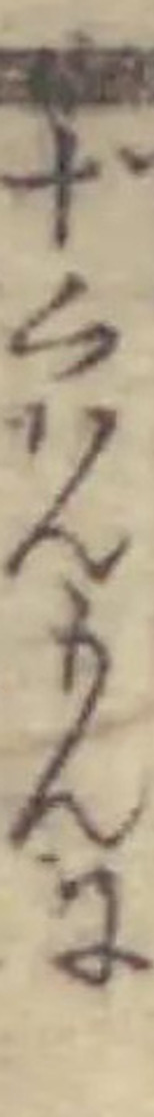十くはんもんに
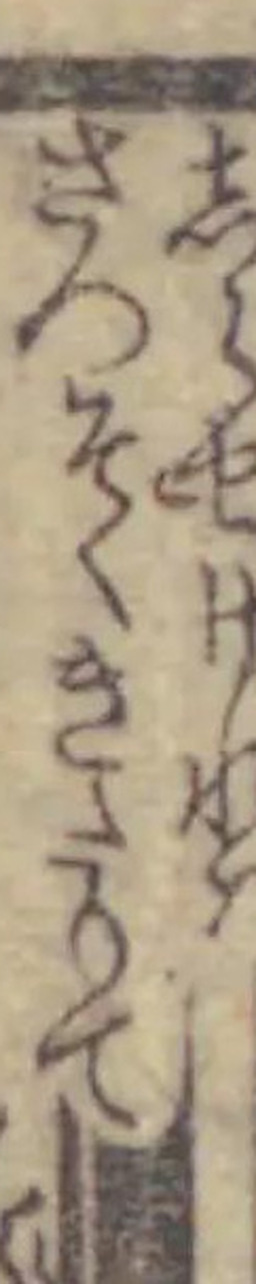さつそくきたりて
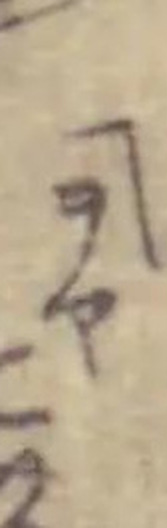〽ヲヤ
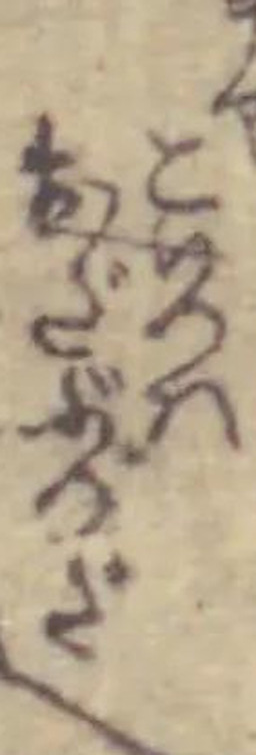おだぶつだ
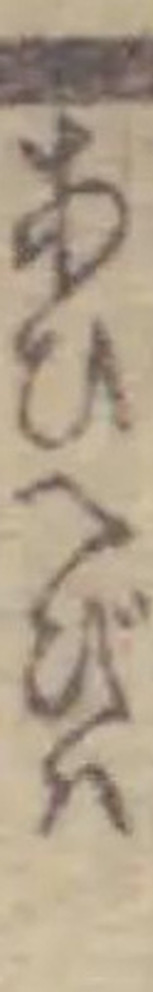あひへびは

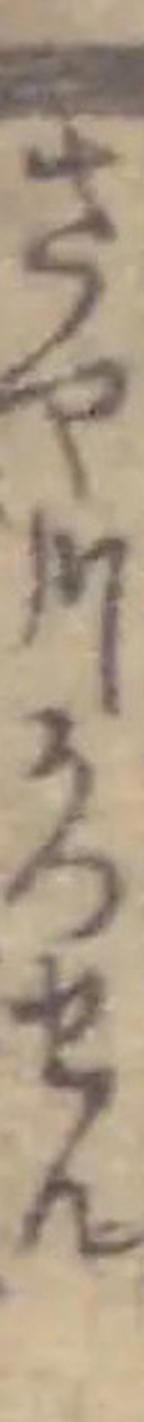さや川かつせん
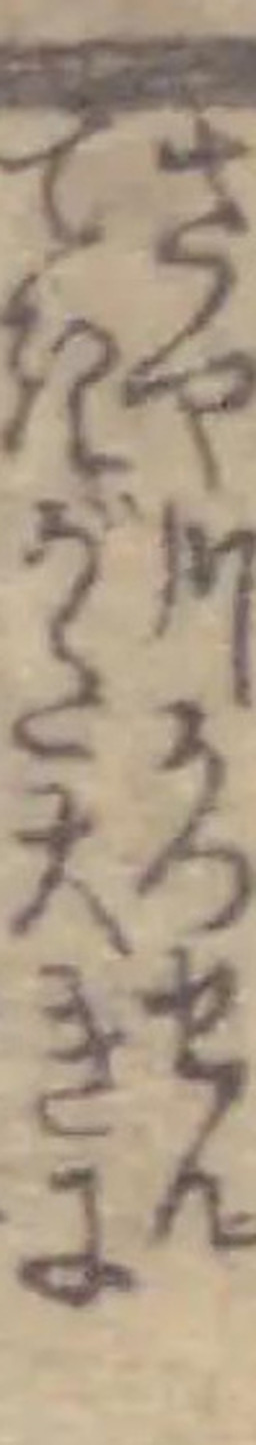てきがた大きに
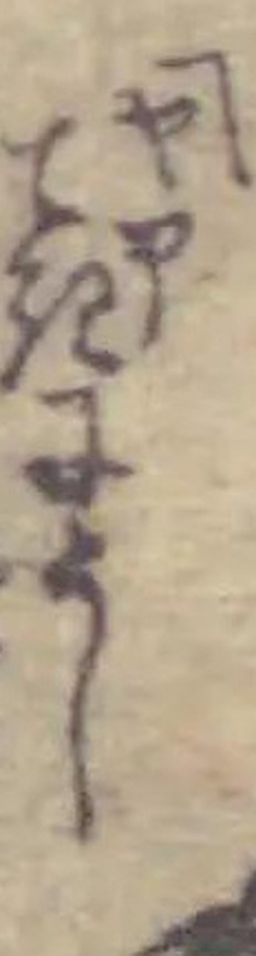てきにうし
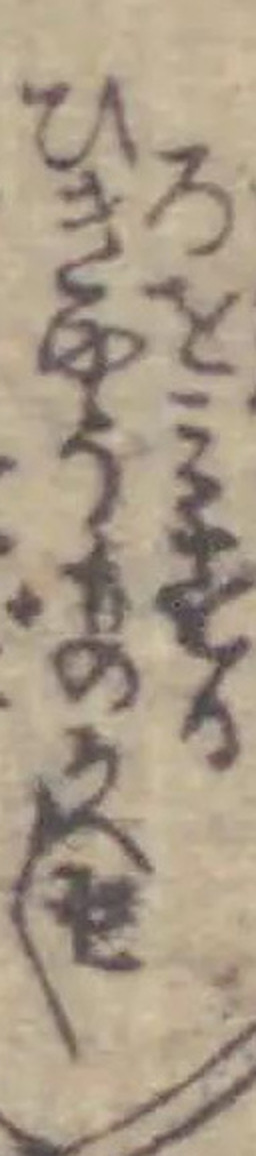ひきやうものかへせ
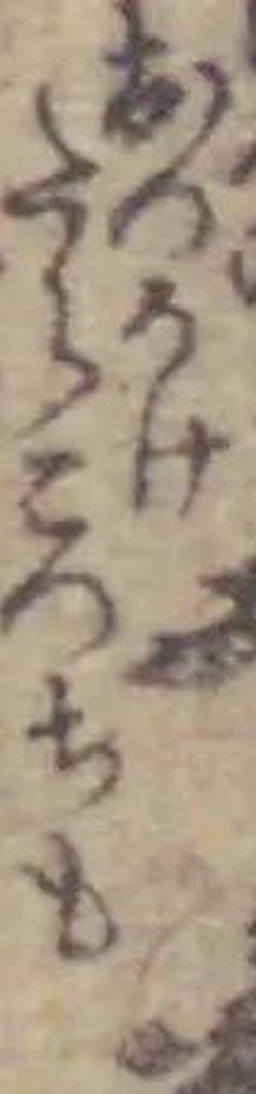たらこつちも
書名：化物太平記 3巻
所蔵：国立国会図書館 National Diet Library, JAPAN
